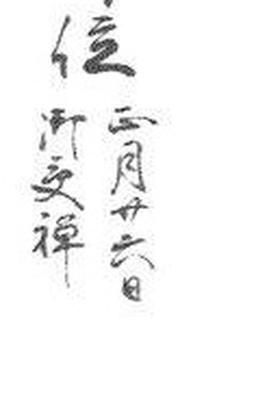一同月廿七日
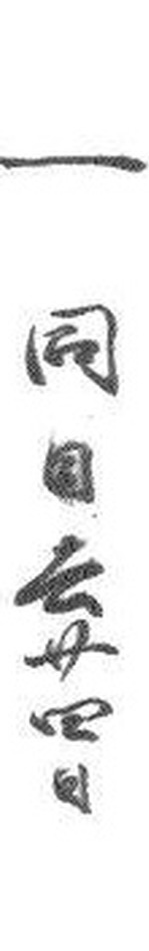一同日去廿四日
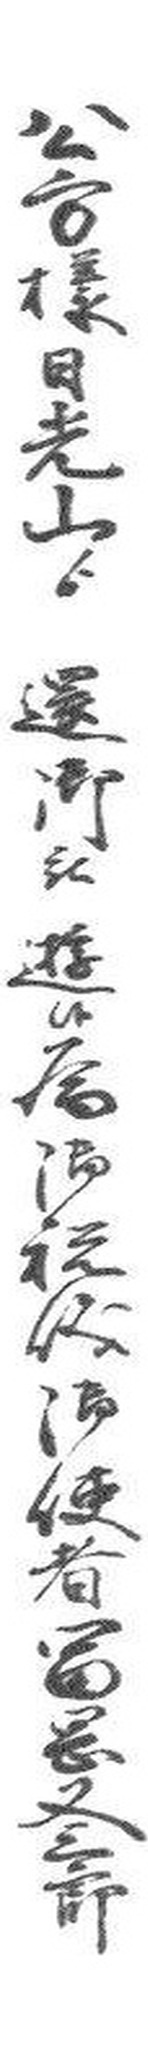公方様日光山ゟ還御被遊候為御祝儀御使者冨岡又三郎
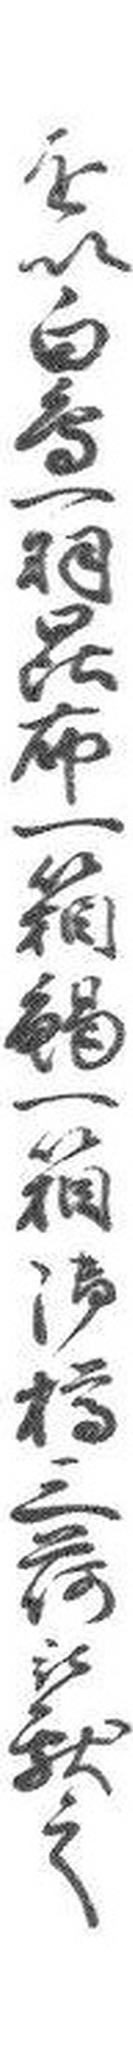を以白鳥一羽昆布一箱鯣一箱御樽三荷被献之
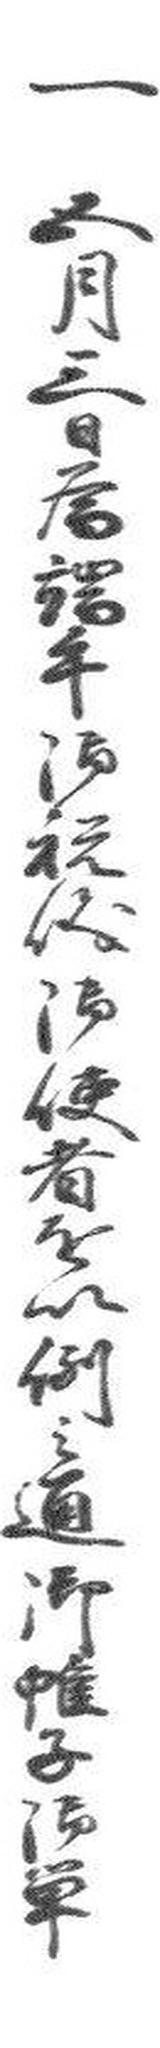一五月三日為端午御祝儀御使者を以例之通御帷子御単
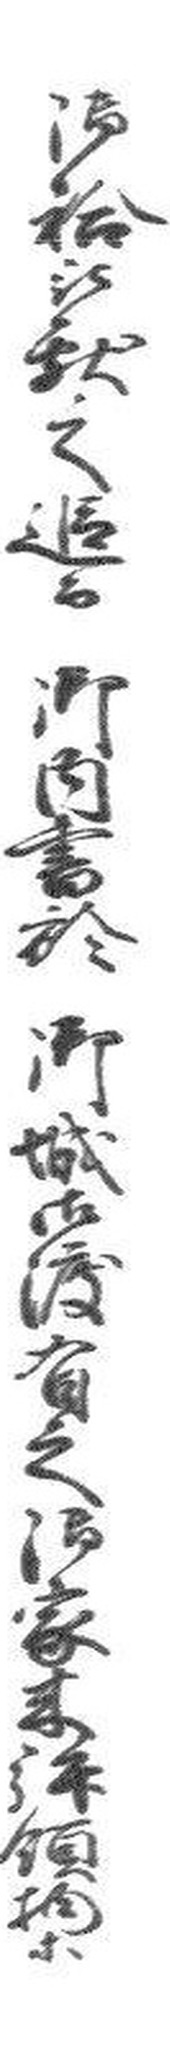御袷被献之追而御内書於御城御渡有之御家来拝領物等
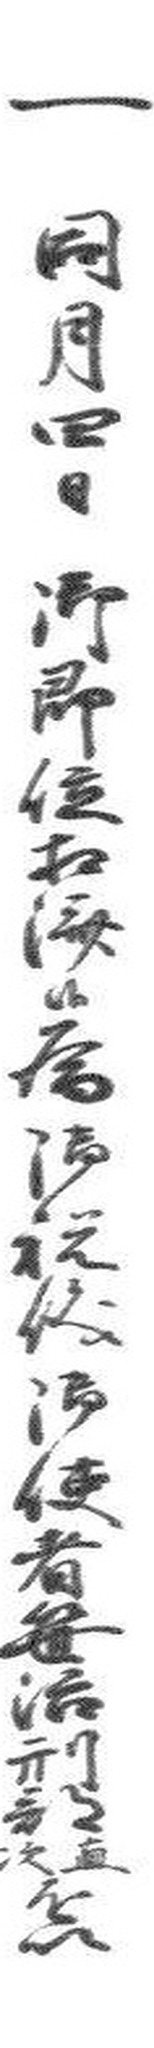一同月四日御即位相済候為御祝儀御使者笹治刑部直次を以
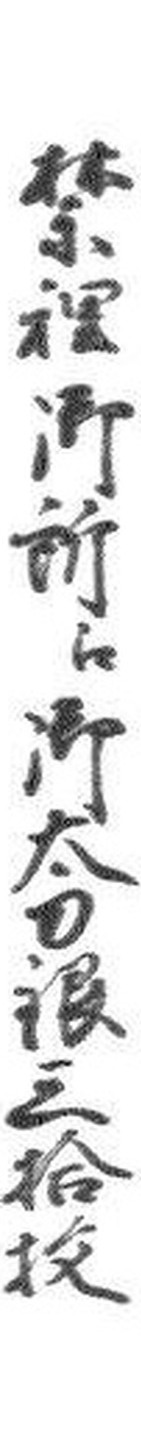禁裡御所江御太刀銀三拾枚
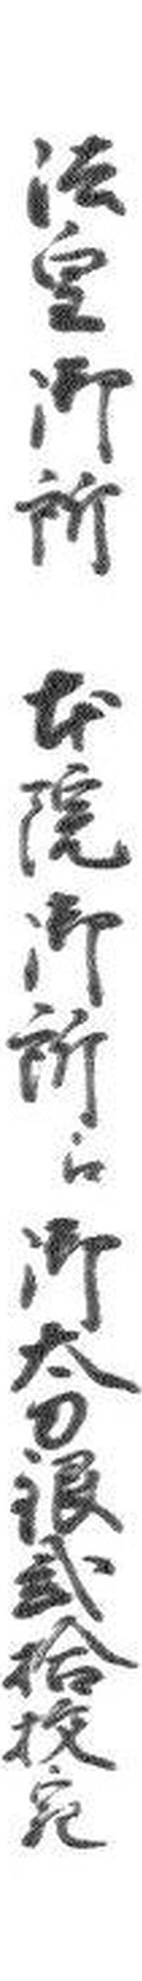法皇御所本院御所江御太刀銀弐拾枚宛
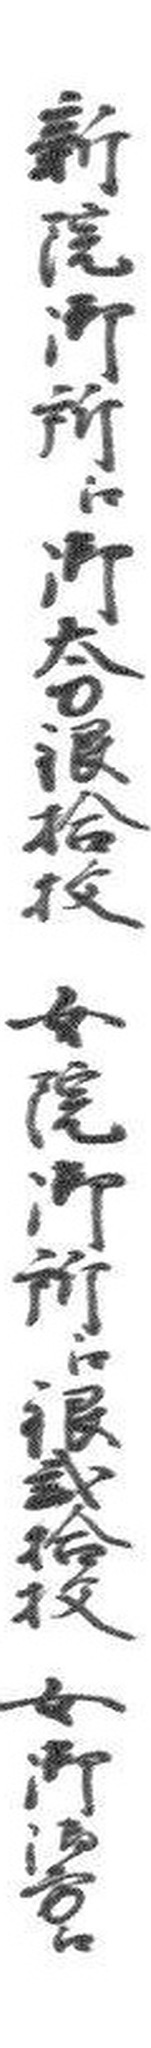新院御所江御太刀銀拾枚女院御所江銀弐拾枚女御御方江
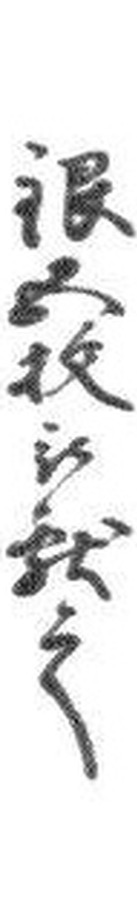銀五枚被献之

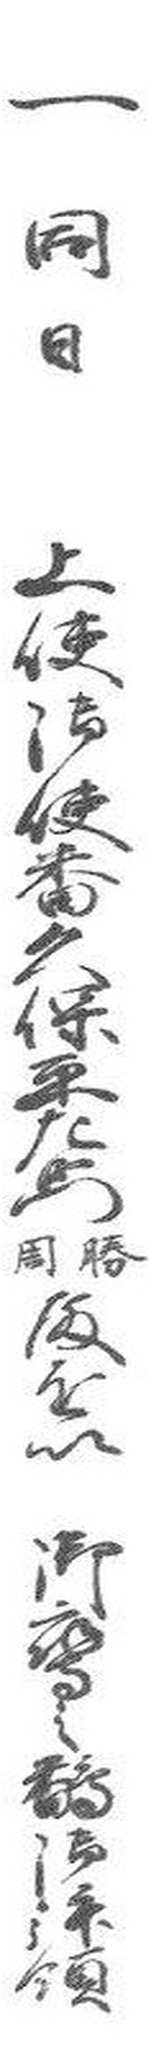一同日上使御使番久保平左衛門勝周殿を以御鷹之鷭御拝領
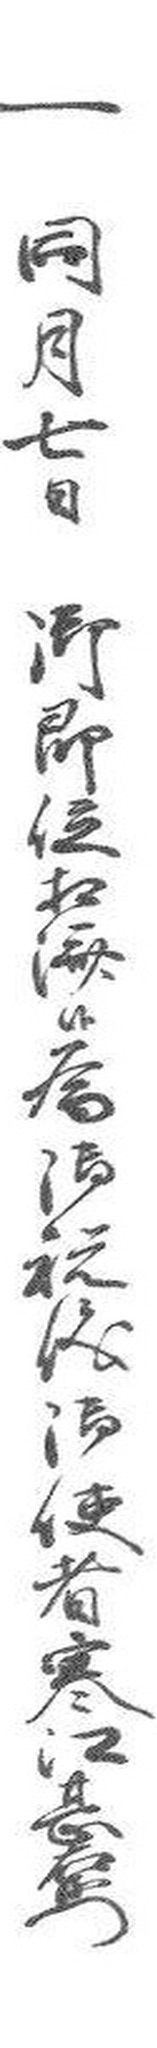一同月七日御即位相済候為御祝儀御使者寒江甚右衛門
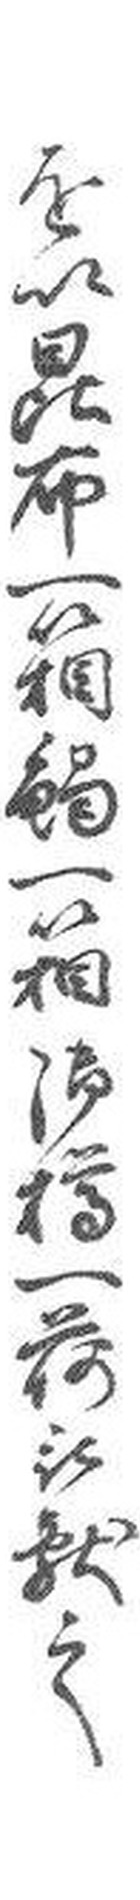を以昆布一箱鯣一箱御樽一荷被献之
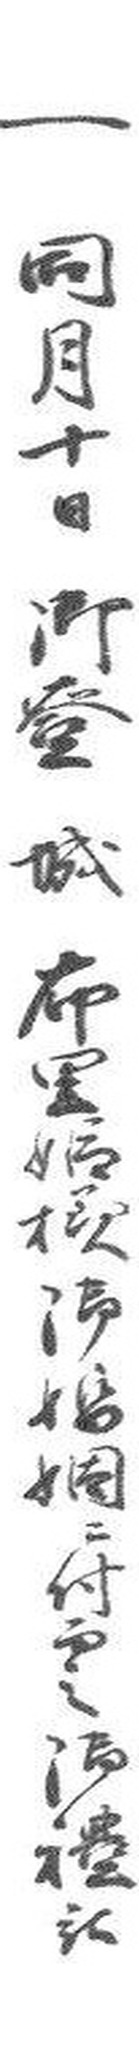一同月十日御登城布里姫様御婚姻ニ付而之御礼被
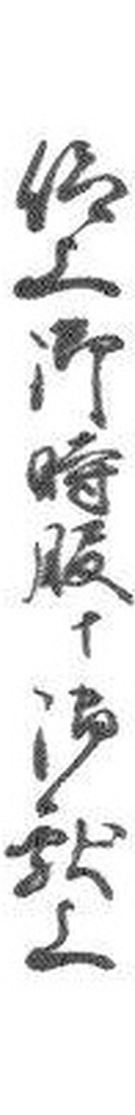仰上御時服十御献上
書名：家譜 六 光通公 従万治三年到寛文三年
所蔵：福井県文書館 Fukui Prefectural Archives
